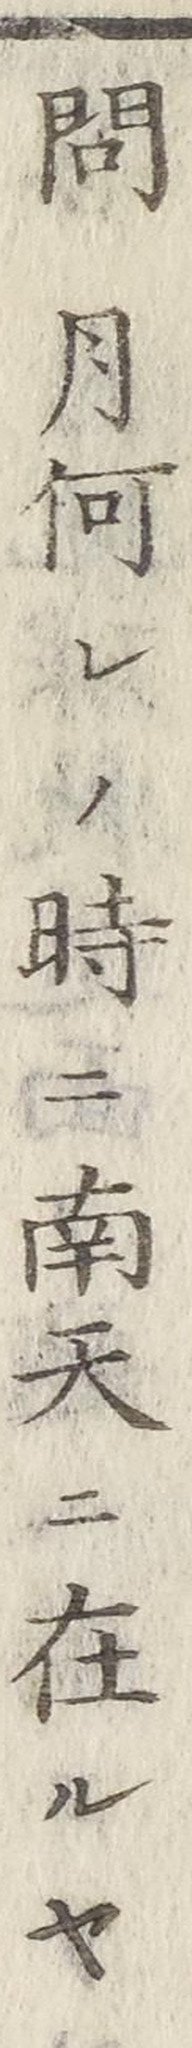問月何レノ時ニ南天ニ在ルヤ
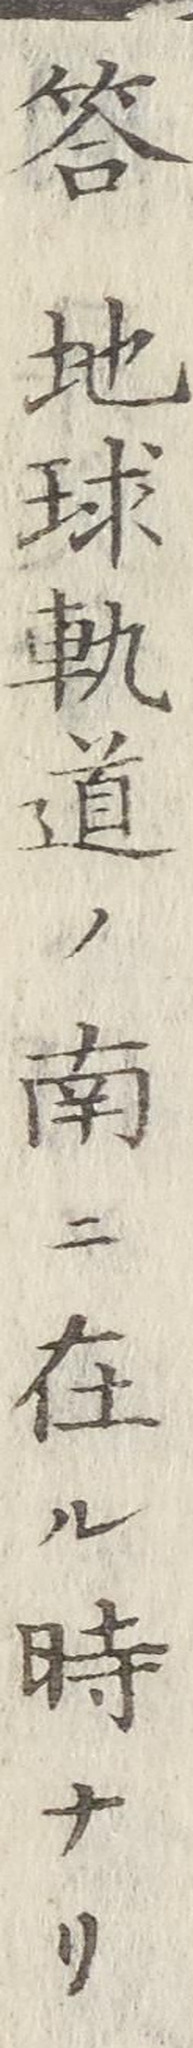答地球軌道ノ南ニ在ル時ナリ
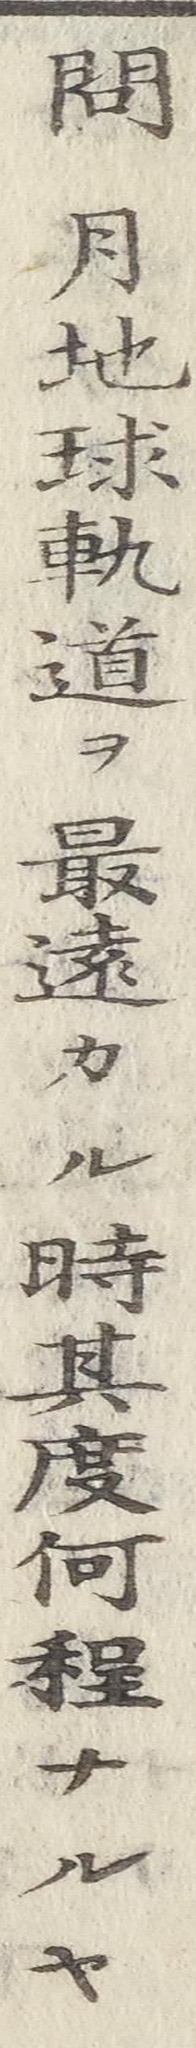問月地球軌道ヲ最遠カル時其度何程ナルヤ
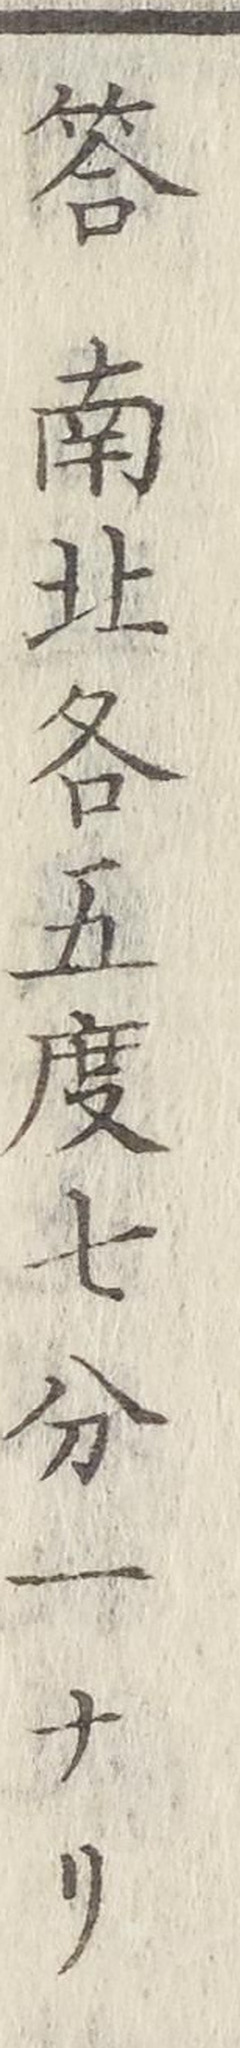答南北各五度七分一ナリ
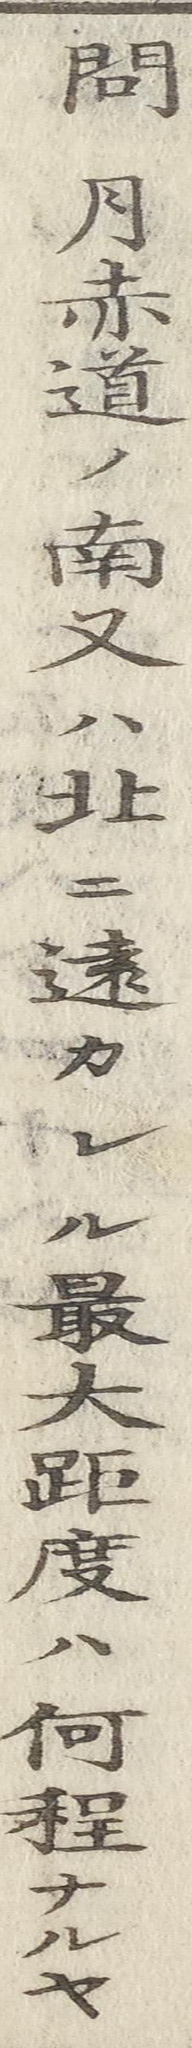問月赤道ノ南又ハ北ニ遠カレル最大距度ハ何程ナルヤ
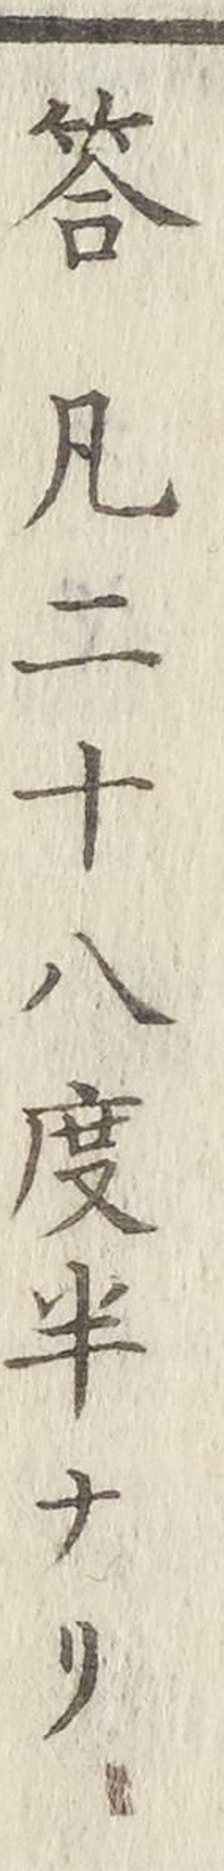答凡二十八度半ナリ
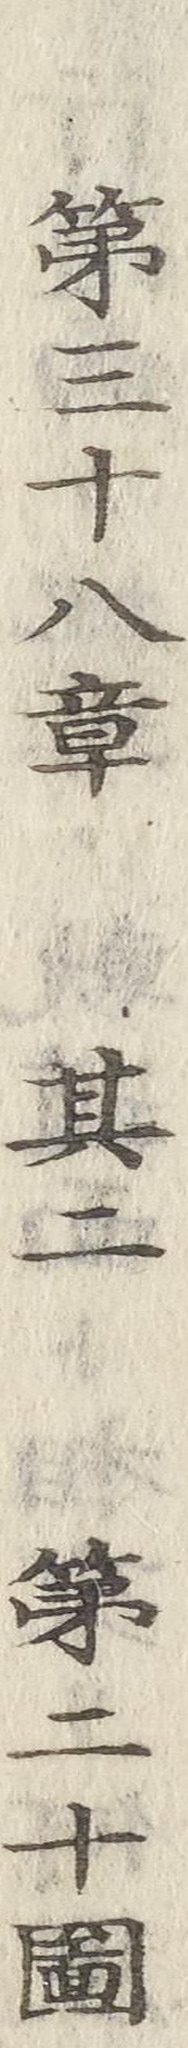第三十八章其二第二十図
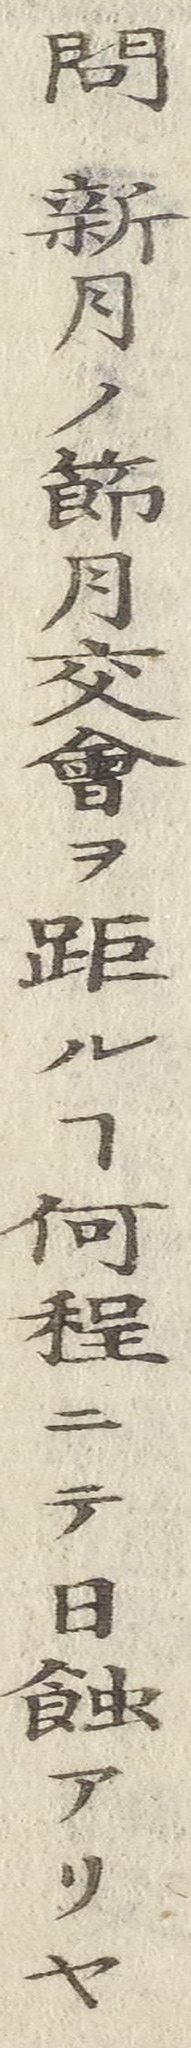問新月ノ節月交会ヲ距ルコト何程ニテ日蝕アリヤ
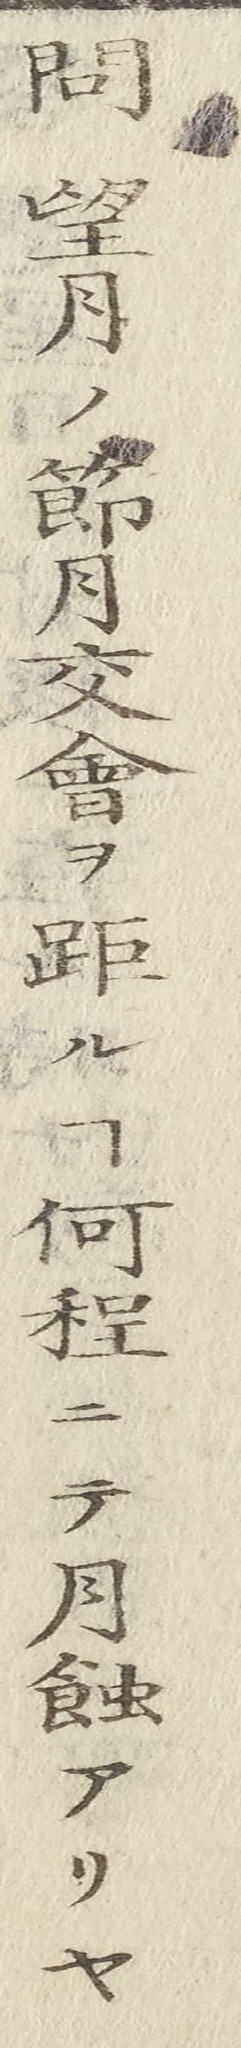問望月ノ節月交会ヲ距ルコト何程ニテ月蝕アリヤ
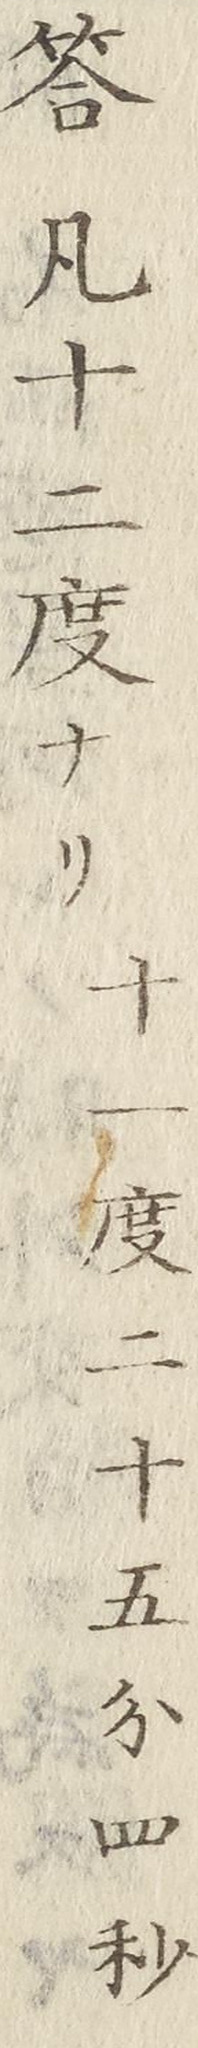答凡十二度ナリ十一度二十五分四秒
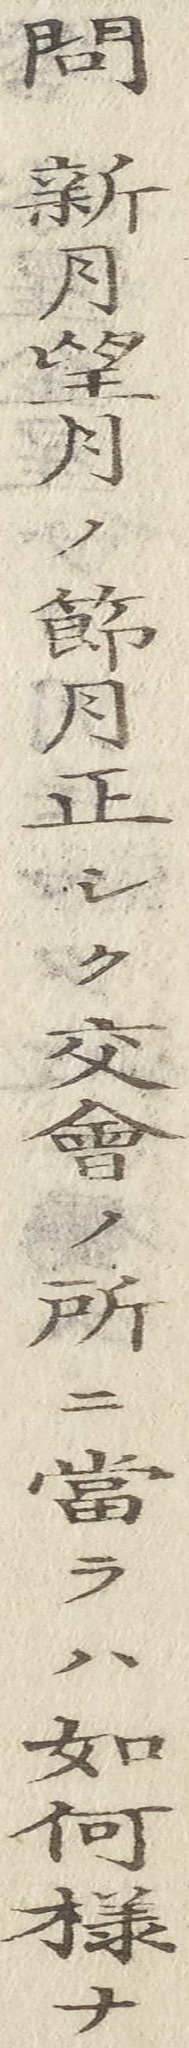問新月望月ノ節月正シク交会ノ所ニ当ラハ如何様ナ
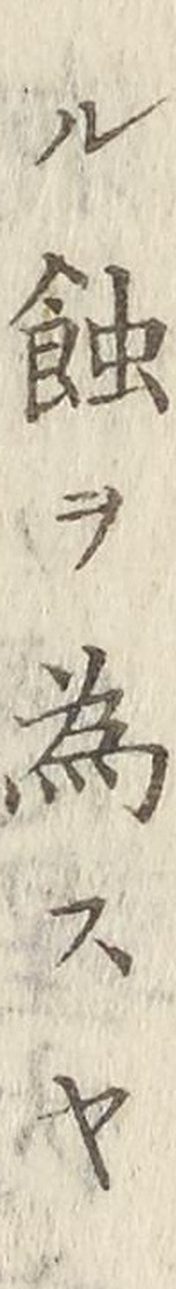ル蝕ヲ為スヤ
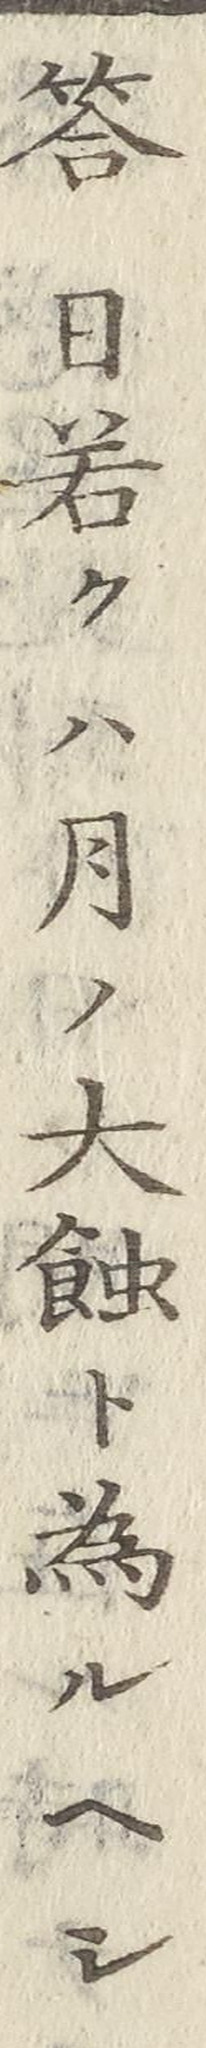答日若クハ月ノ大蝕ト為ルヘシ
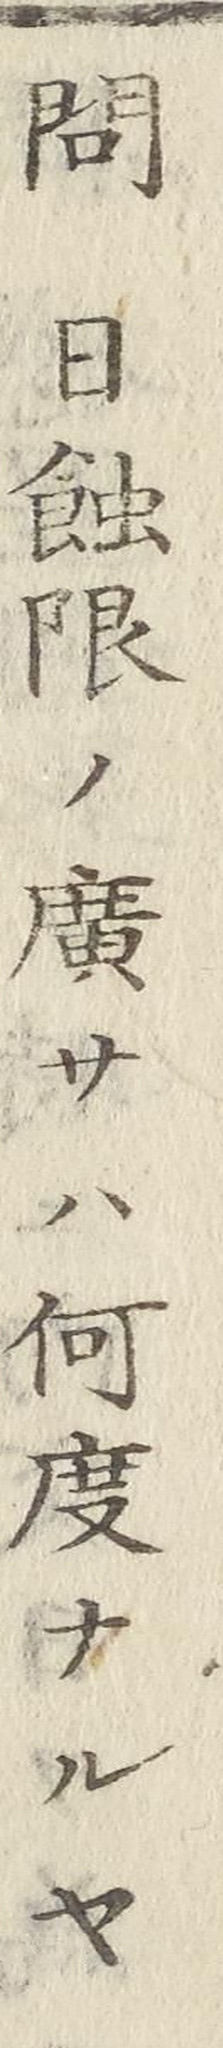問日蝕限ノ広サハ何度ナルヤ
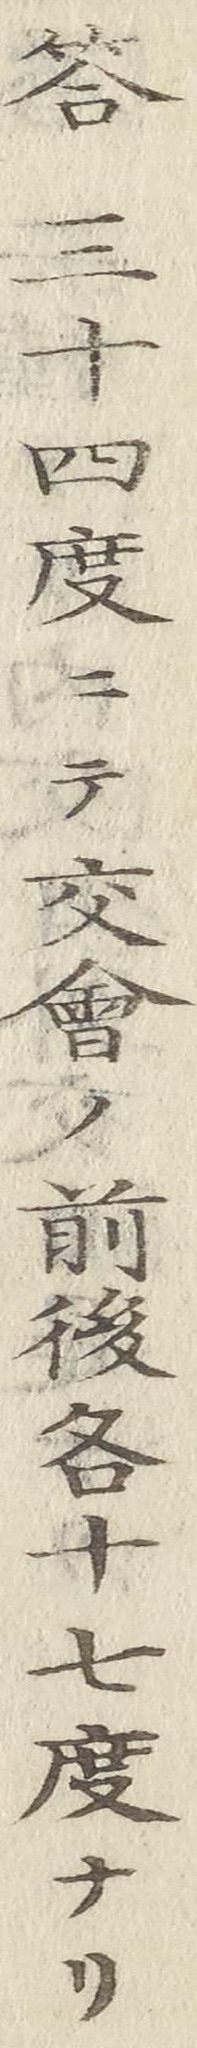答三十四度ニテ交会ノ前後各十七度ナリ
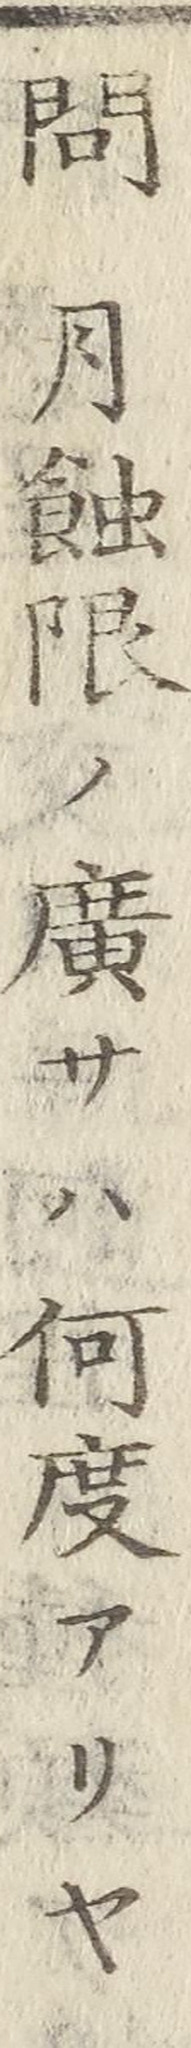問月蝕限ノ広サハ何度アリヤ
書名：星学圖説　下
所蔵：東京大学地震研究所図書室 Earthquake Research Institute Library, The University of Tokyo, JAPAN
